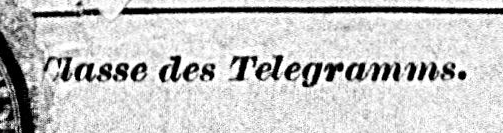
Classe des Telegramms.
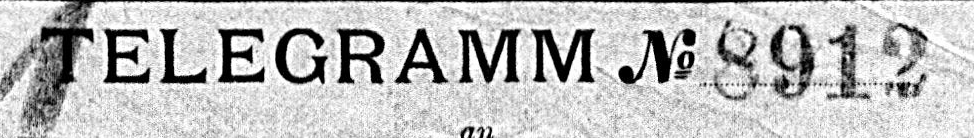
TELEGRAMM Nr. 8912
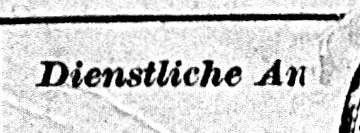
Dienstliche Anxx
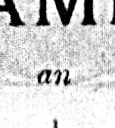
an
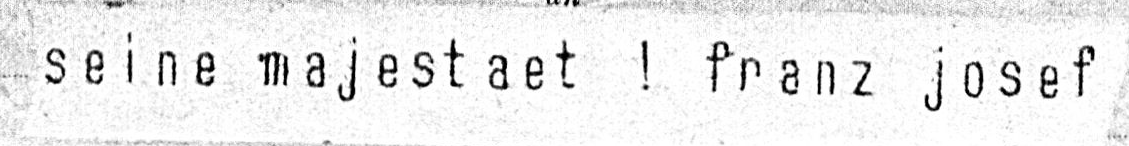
seine majestaet ! franz josef
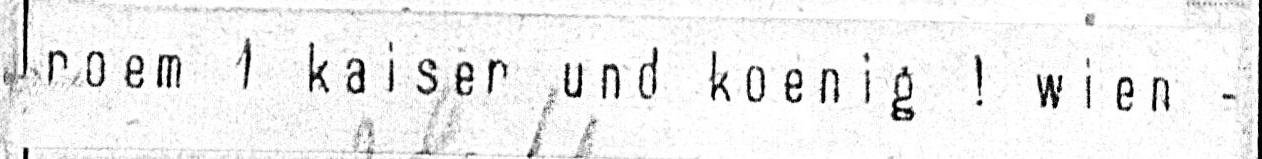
roem 1 kaiser und koenig ! wien -
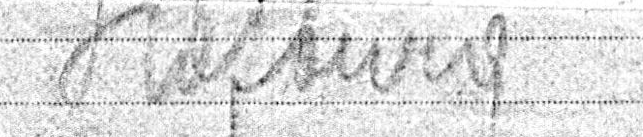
Hofburg
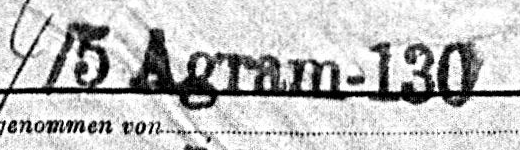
5 Agram-130
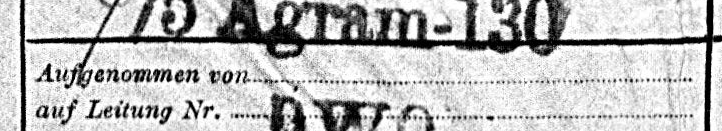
Aufgenommen von
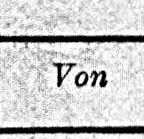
Von
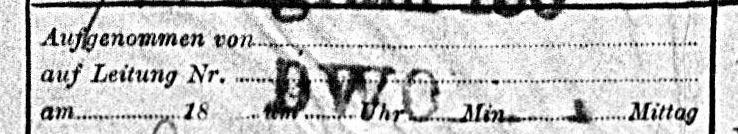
auf Leitung Nr.
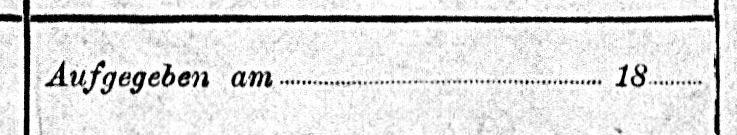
Auggegeben am 18
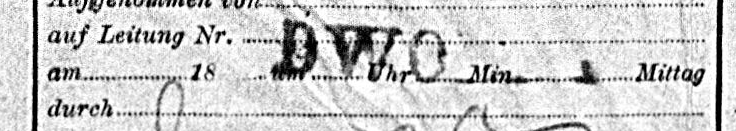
am 18 Uhr Min. Mittag
